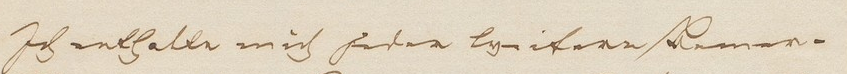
Ich enthalte mich jeder weitern Bemer-
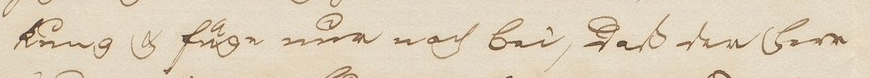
kung & füge nur noch bei, daß der Herr
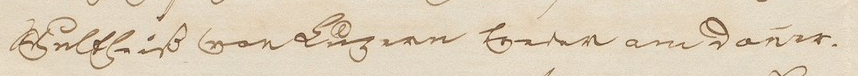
Schultheiß von Luzern weder am Donner-
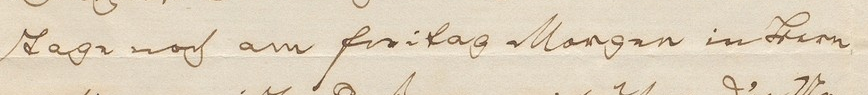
stage noch am Freitag Morgen in Bern
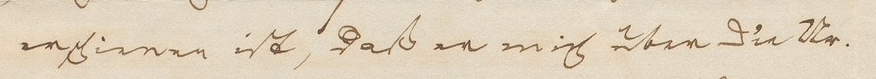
erschienen ist, daß er mich über die Ur-
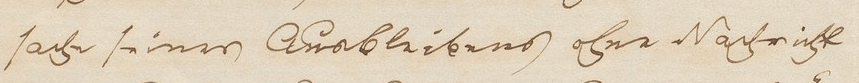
sache seines Ausbleibens ohne Nachricht
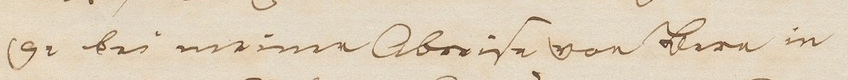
ge bei meiner Abreise von Bern in
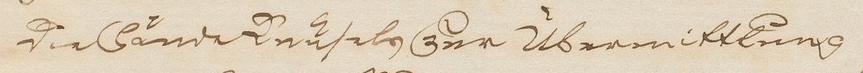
die Hände Knüsels zur Übermittlung
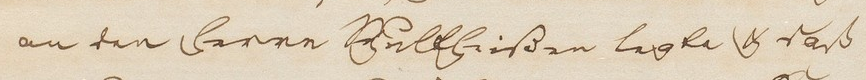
an den Herrn Schultheißen legte & daß
